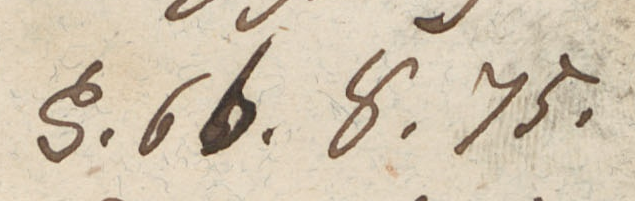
§. 66. S. 75.
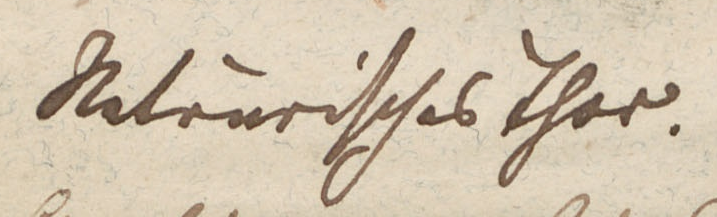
Hetrurisches Thor.
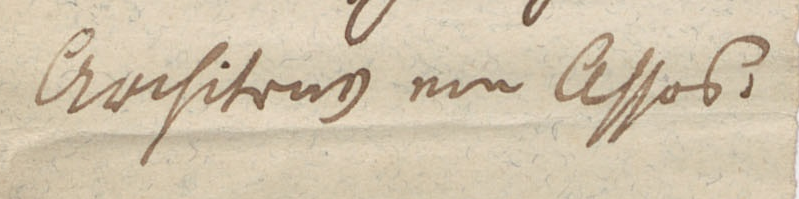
Architrav von Assos.
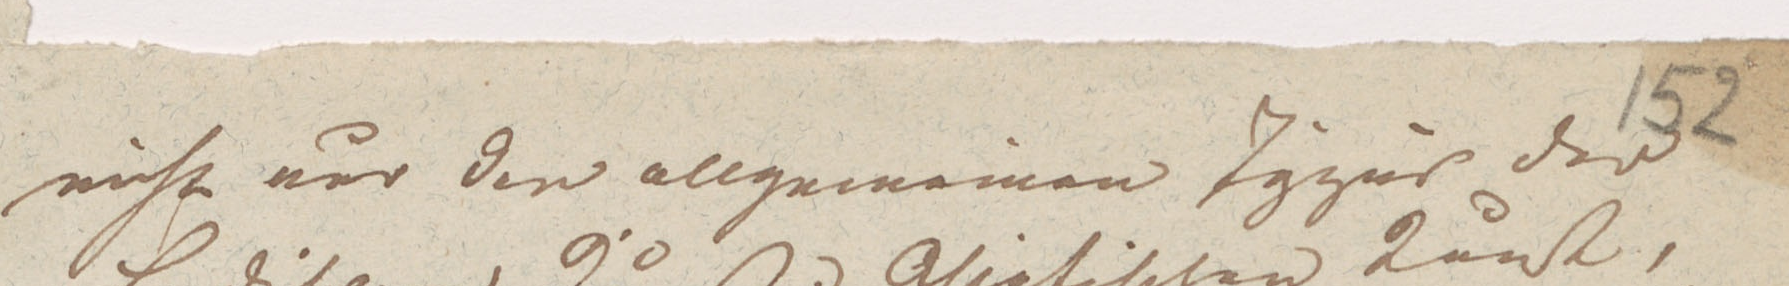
nicht nur den allgemeinen Typus der
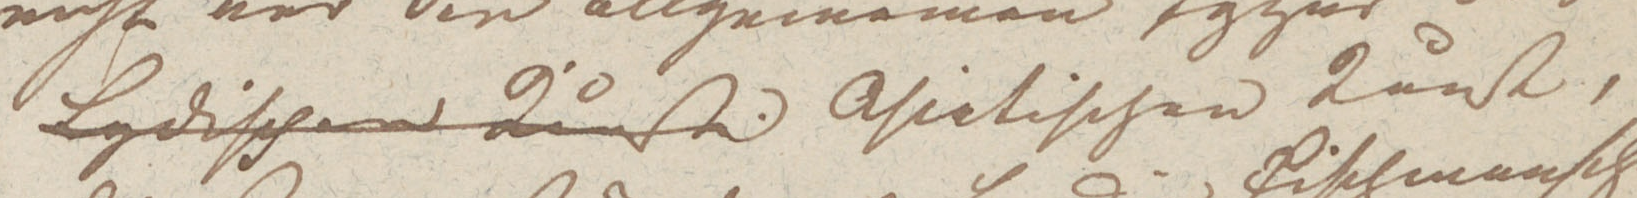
Lydischen Kunst Asiatischen Kunst,
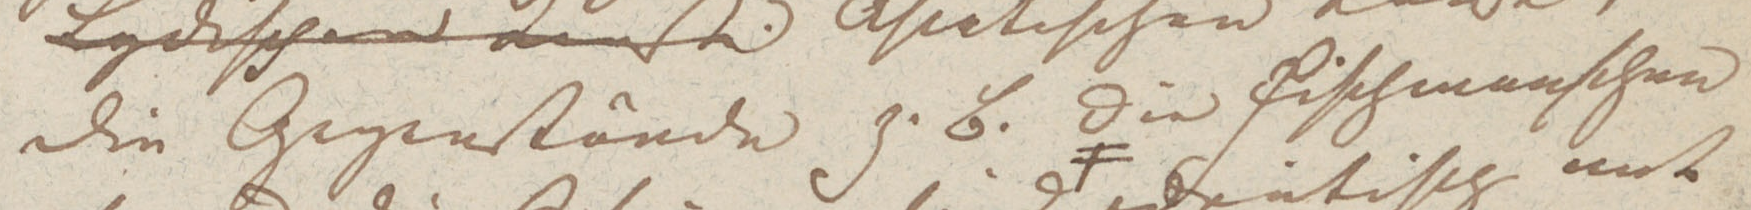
die Gegenstände z.B. die Fischmenschen
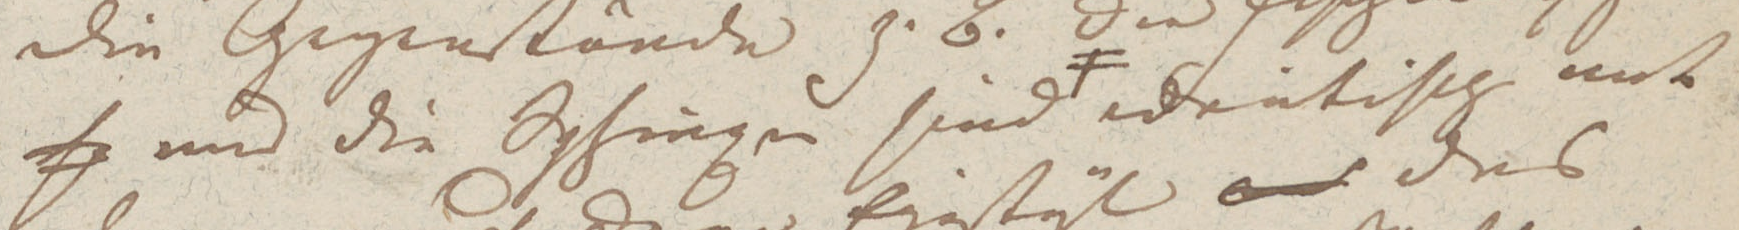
so und die Sphinxe sind % identisch mit
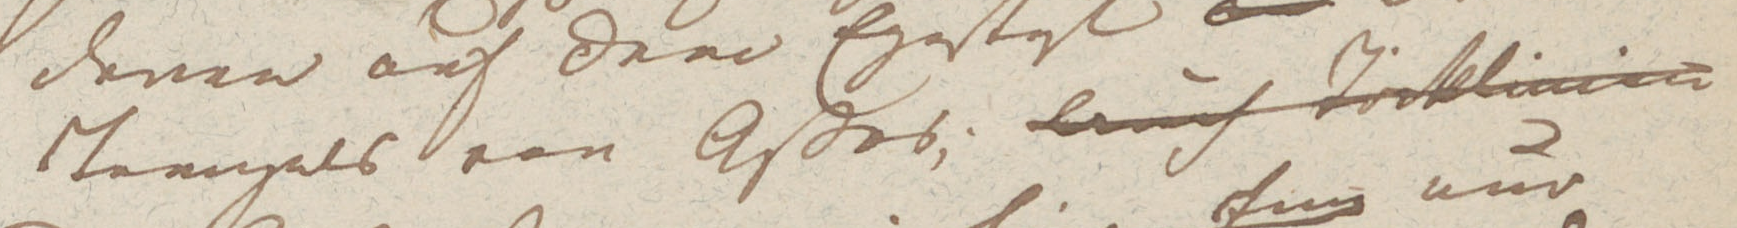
Tempels von Assos; Auch Triklinien
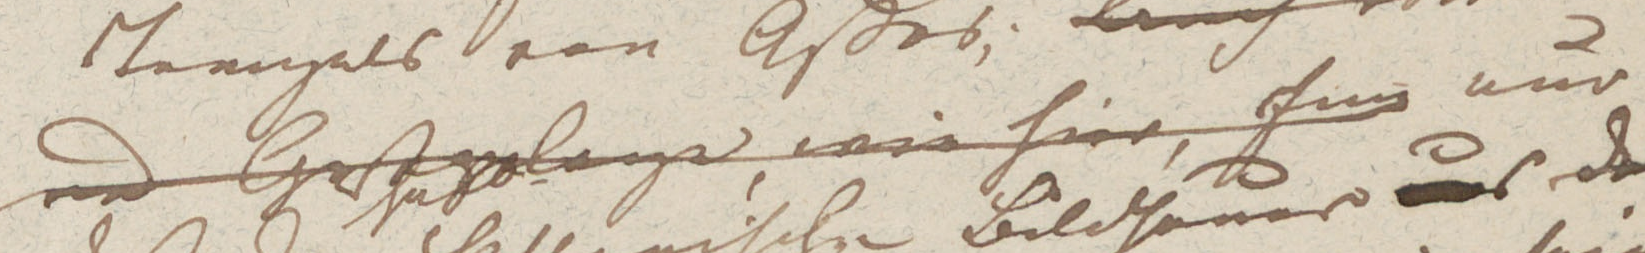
und Gastgelege, wie hier, f nur
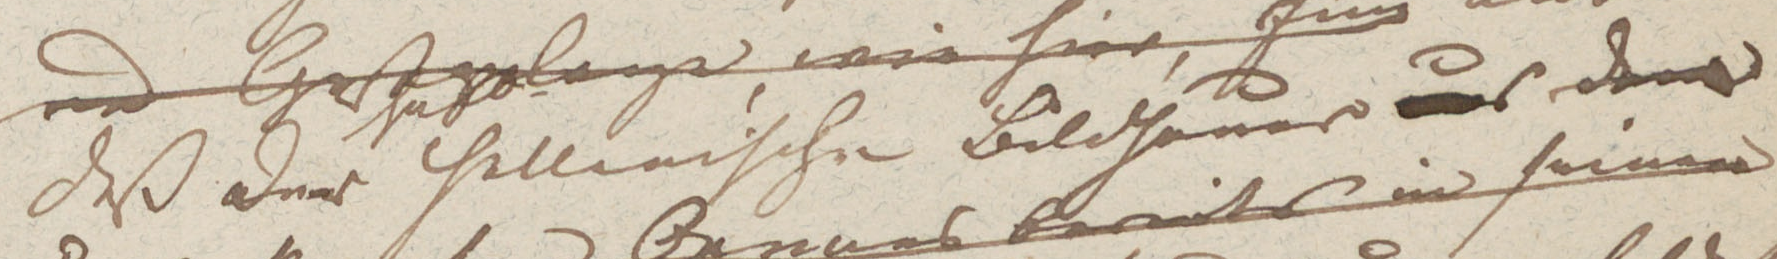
dass der halb-Hellenische Bildhauer aus dem
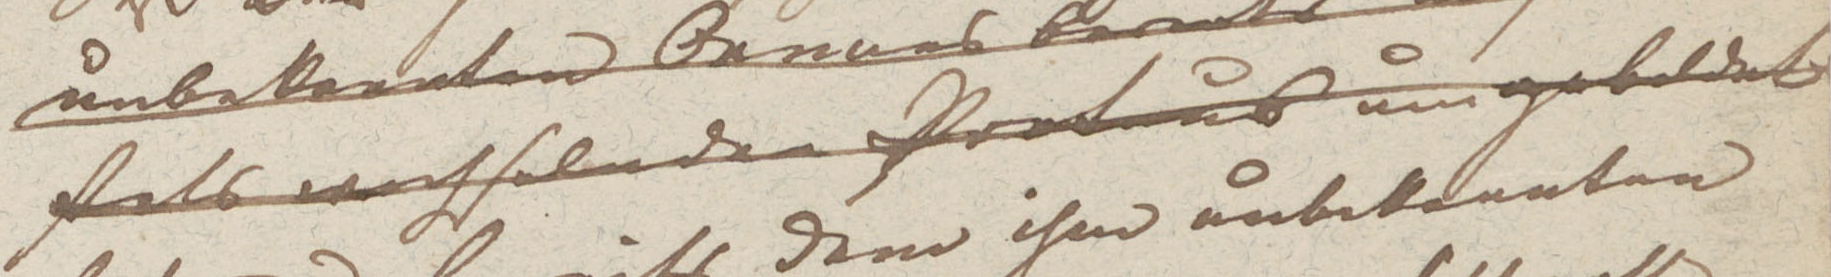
stets wechselnden Proteus umgebildet
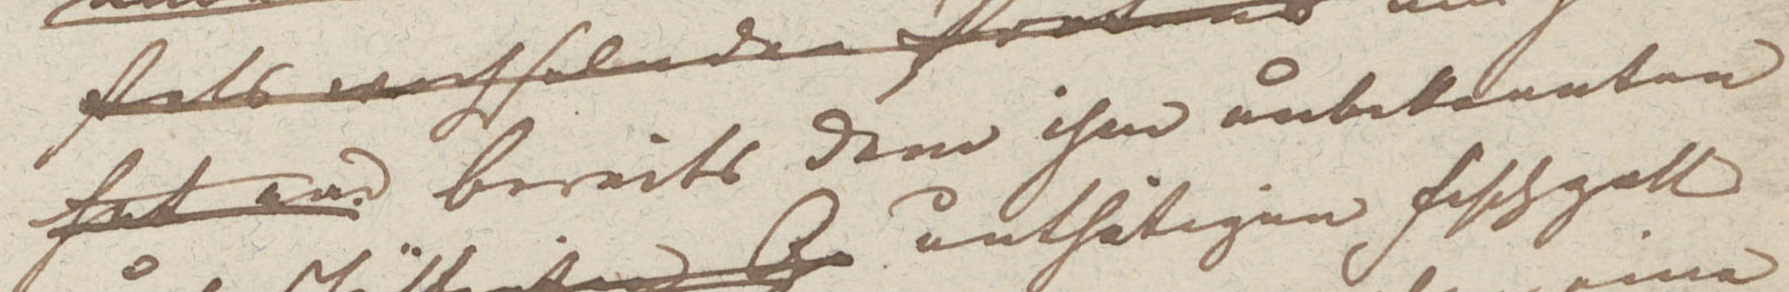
hat und bereits dem ihm unbekannten
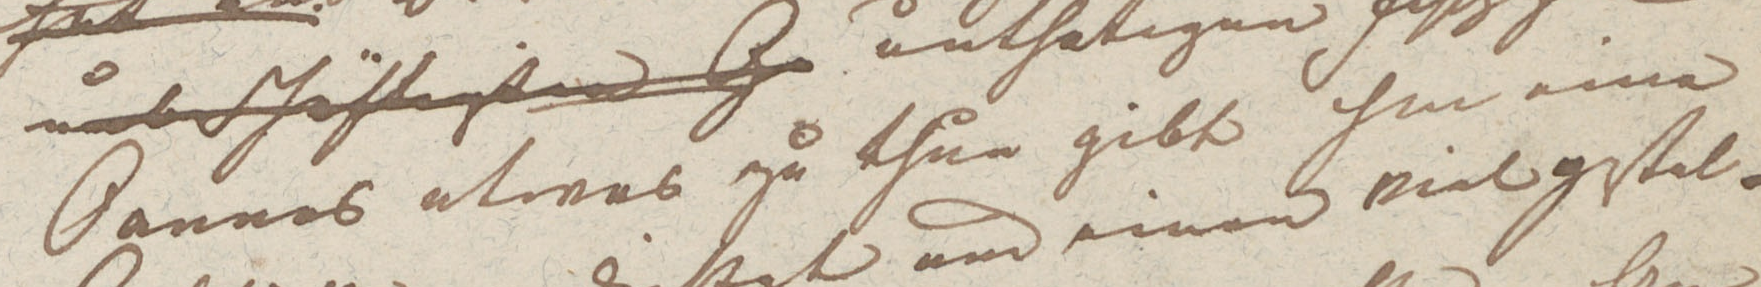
Oannes etwas zu thun gibt ihm eine
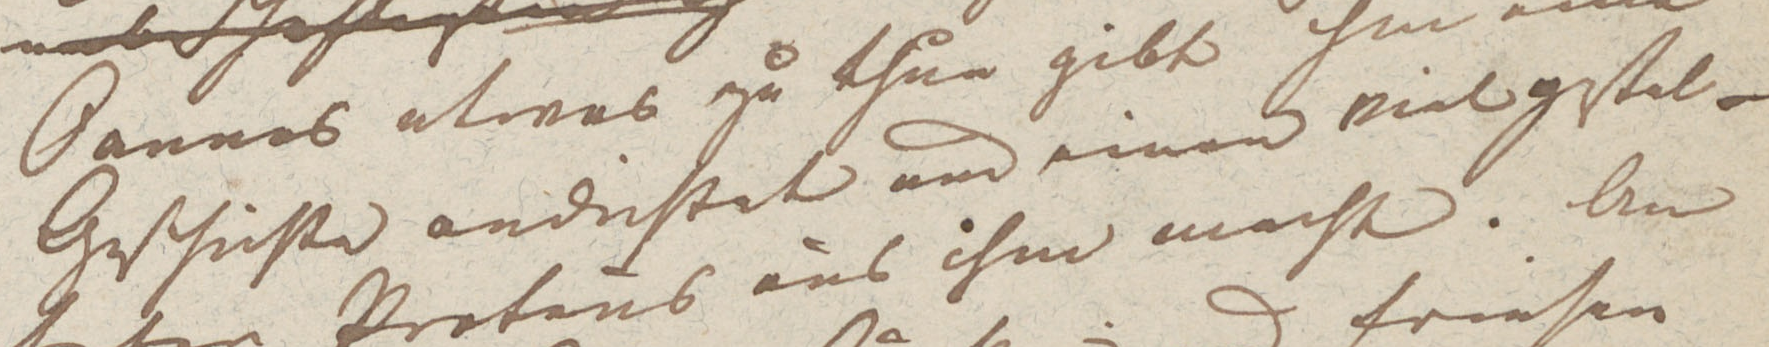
Geschichte andichtet und einen vielgestal-
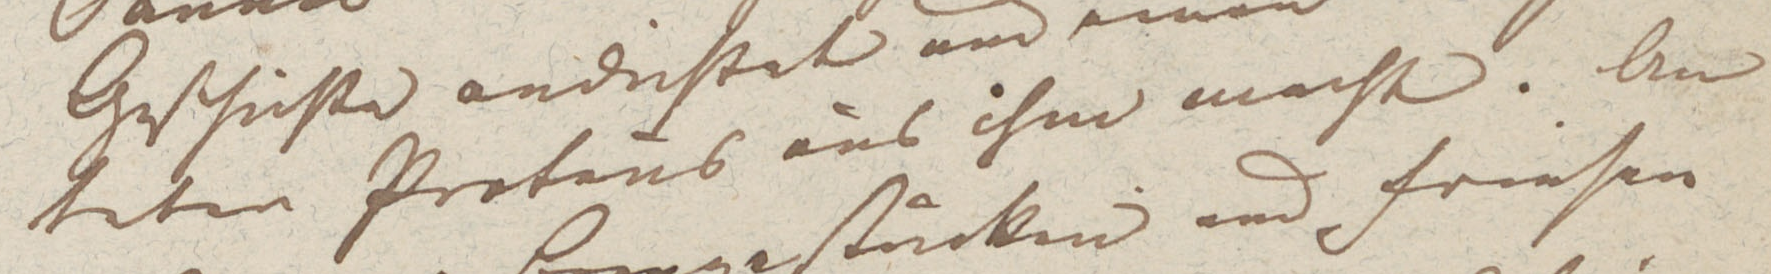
teten Proteus aus ihm macht. An
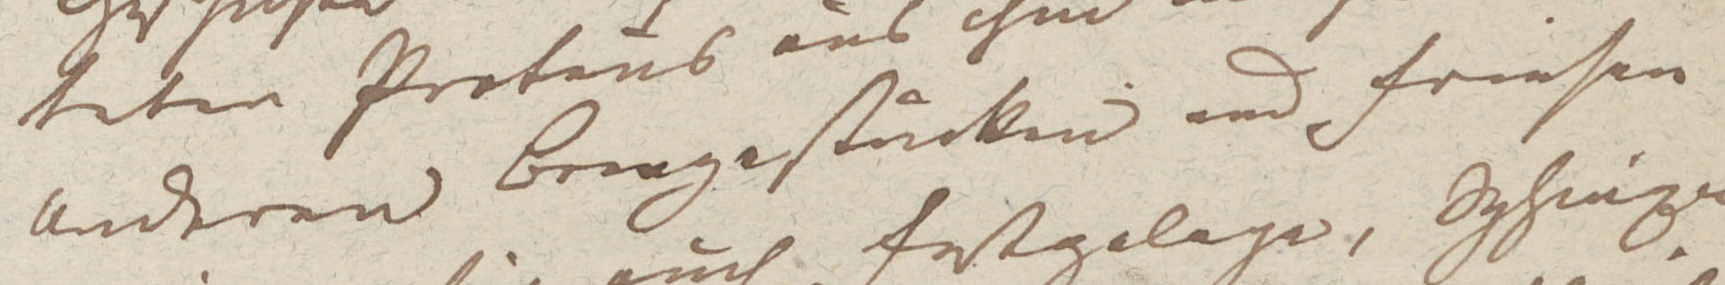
anderen Bronzestücken und Friesen
